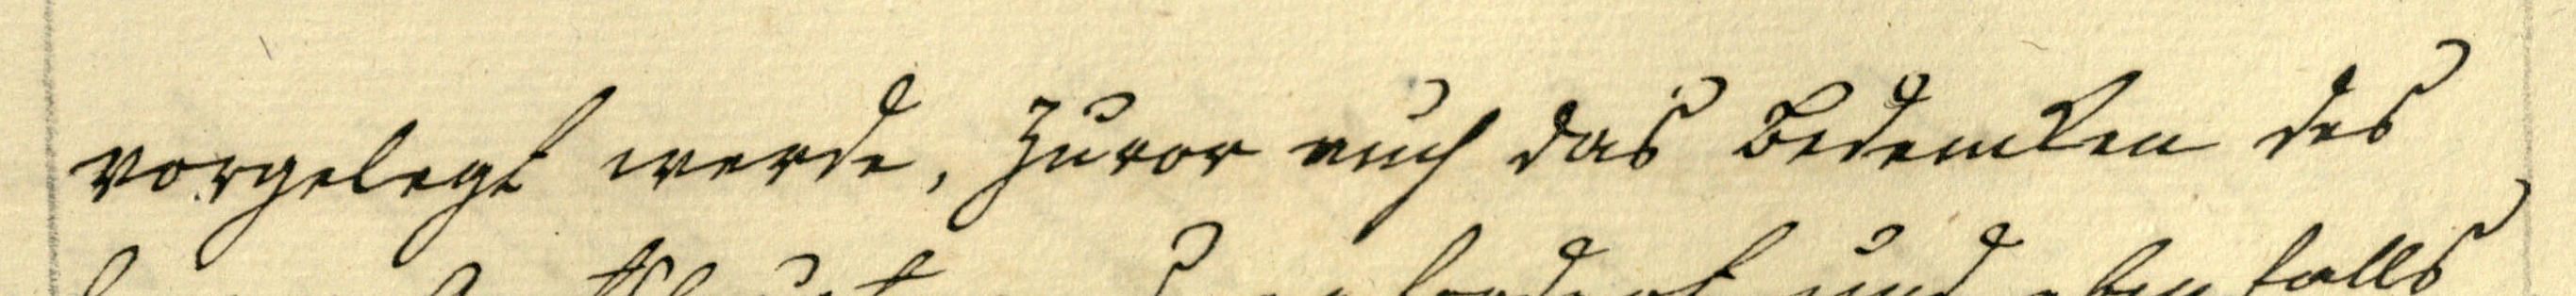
vorgelegt werde, zuvor auch das Bedencken des
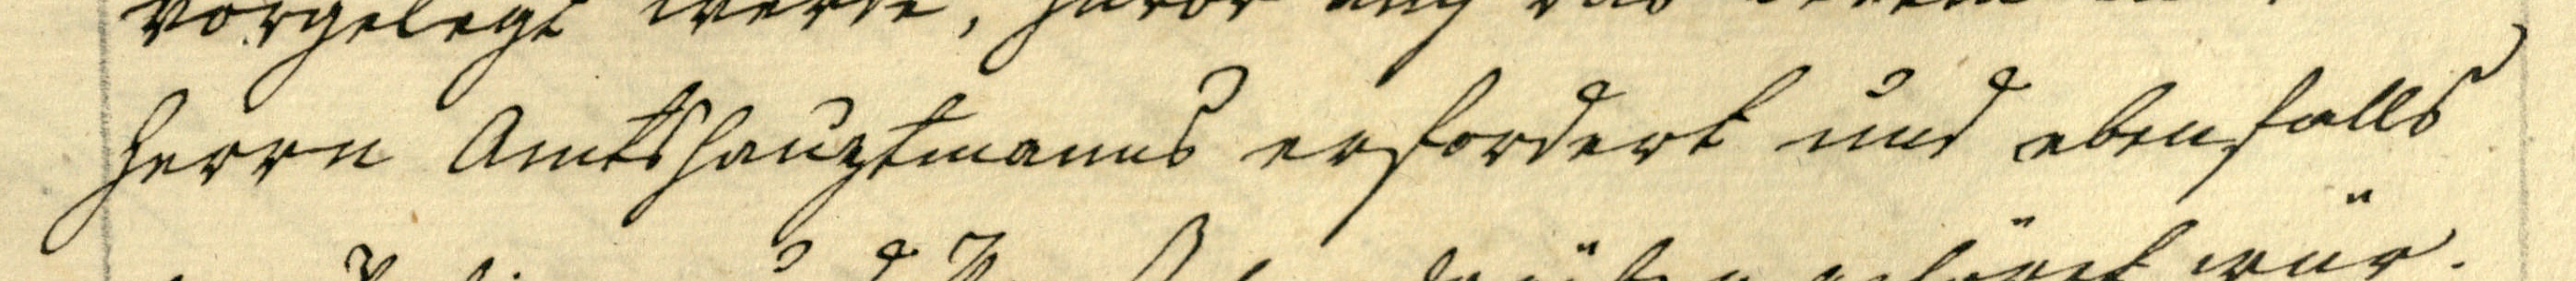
Herrn Amtshauptmanns erfordert und ebenfalls
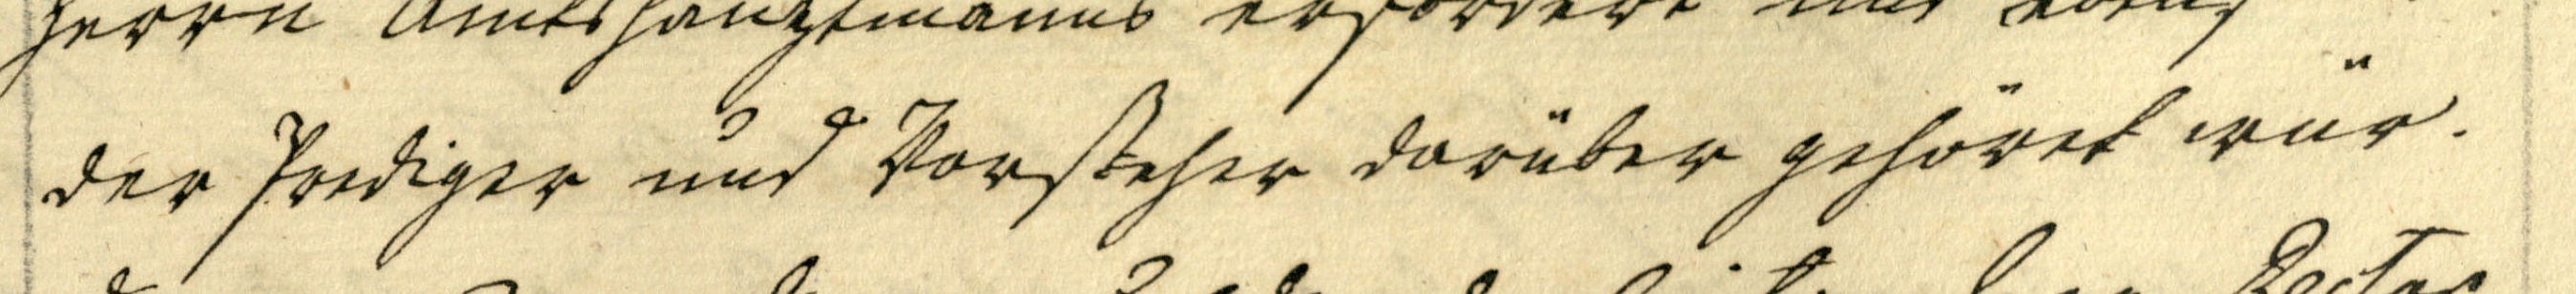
der Prediger und Vorsteher darüber gehöret wür¬
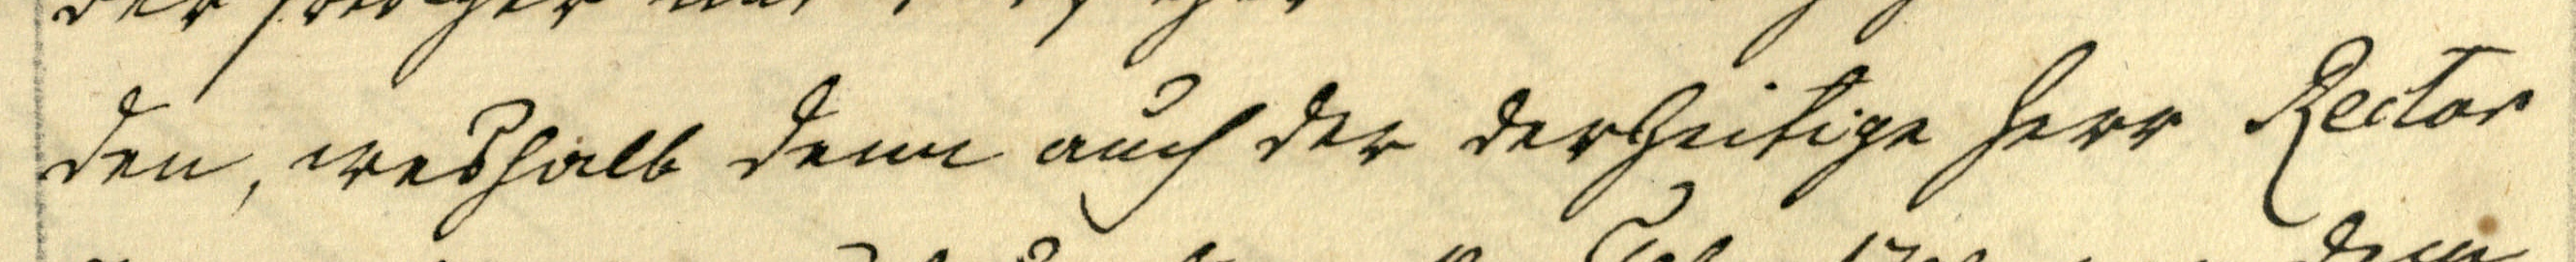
den, weshalb denn auch der derzeitige Herr Rector
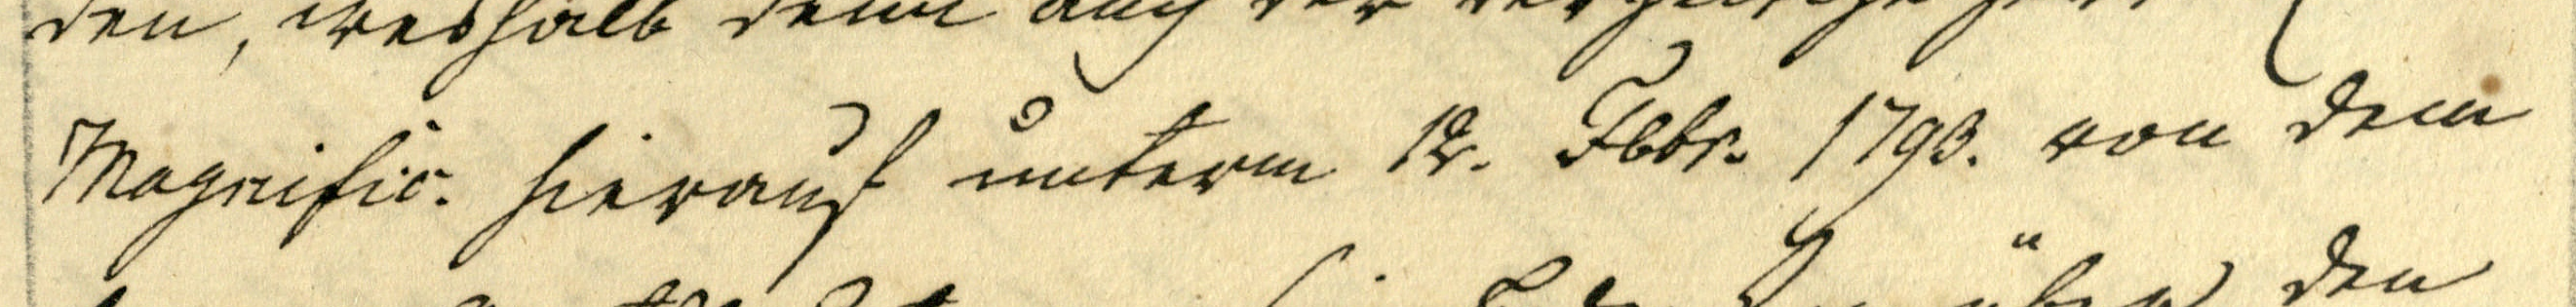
Magnific. hierauf unterm 12. Febr. 1793. von dem
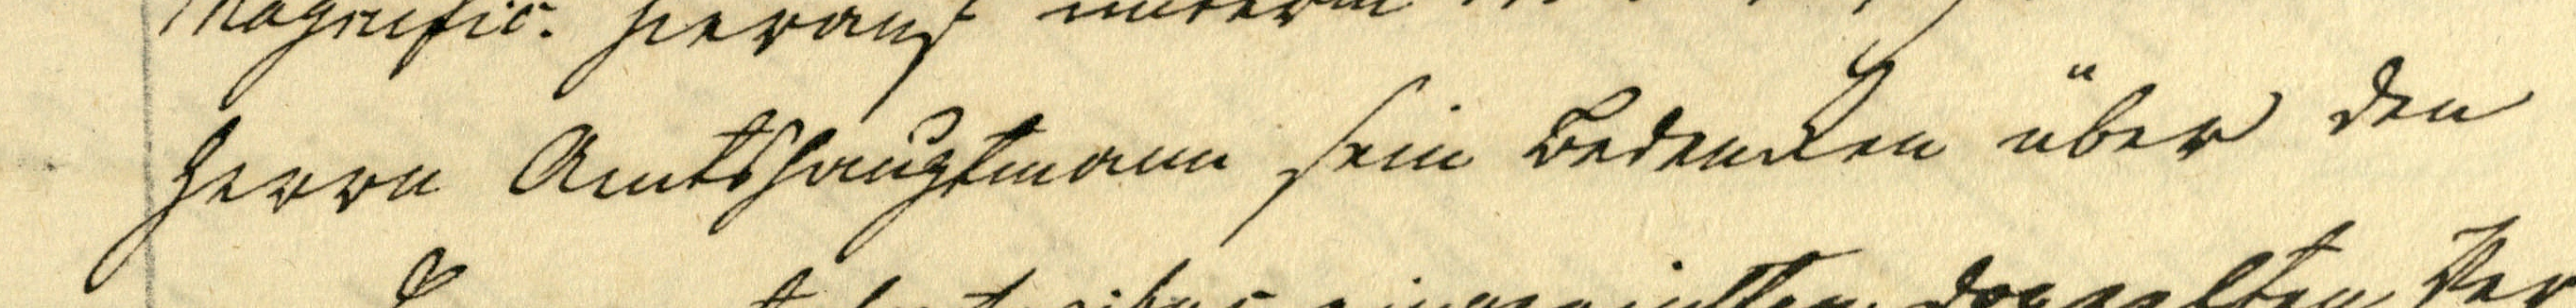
Herrn Amtshauptmann sein Bedencken über den
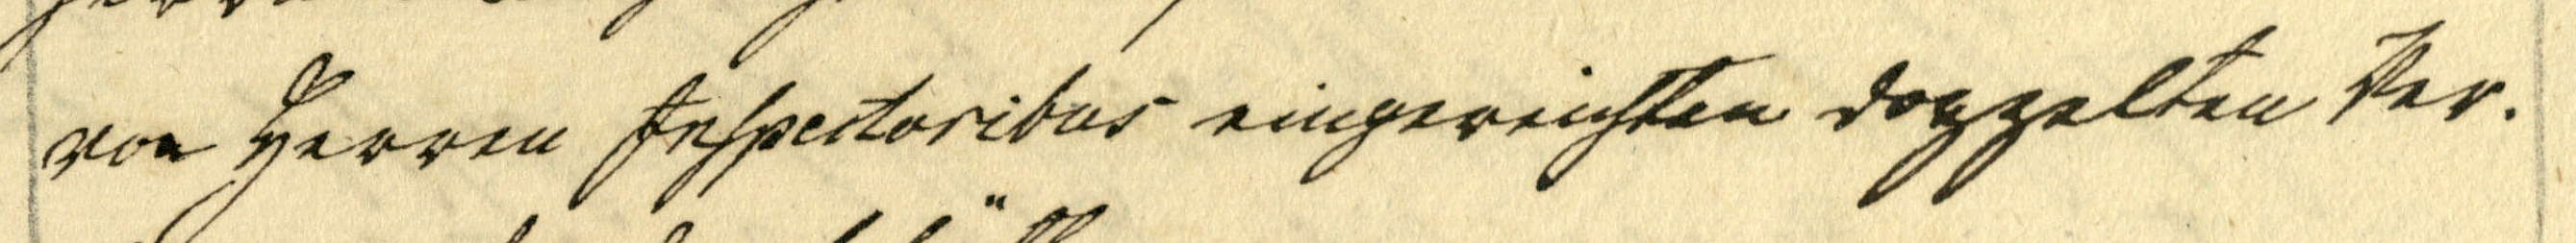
von Herren Inspectoribus eingereichten doppelten Ver¬
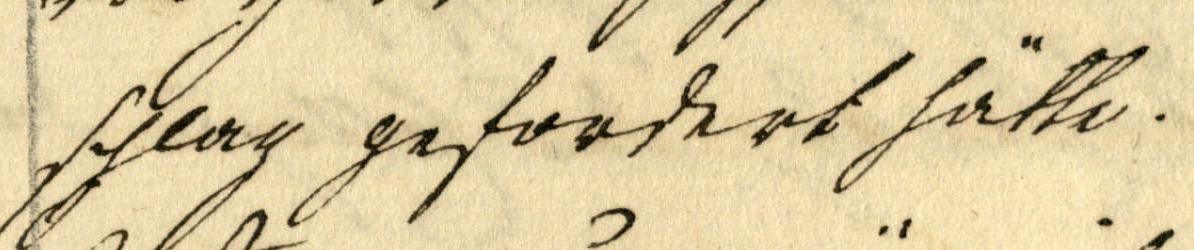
schlag gefordert hätte.
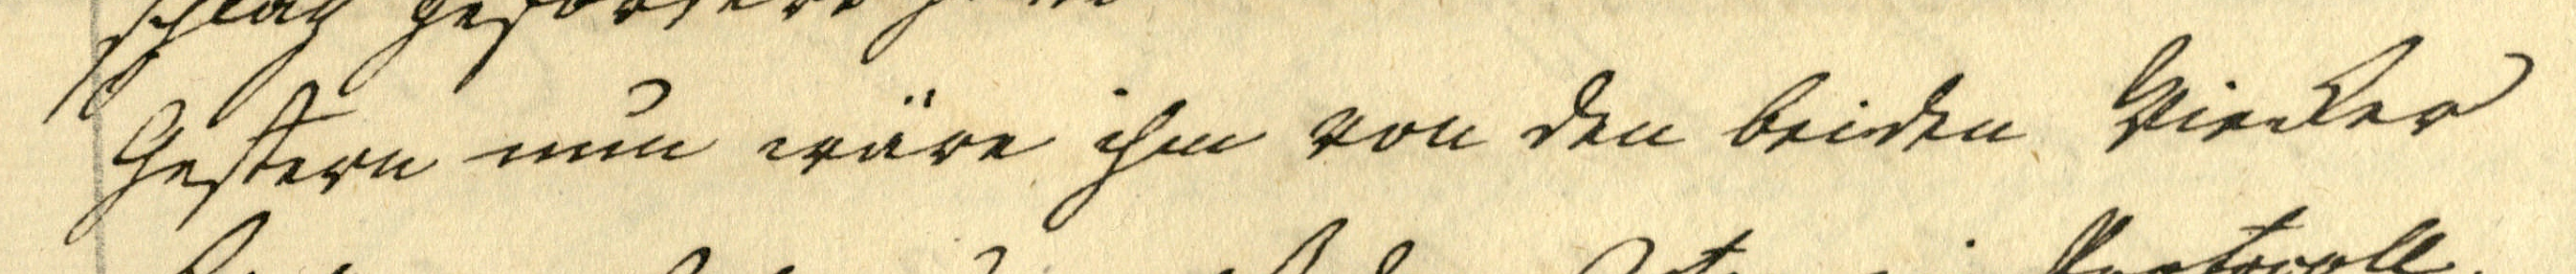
Gestern nun wäre ihm von den beiden Wiecker
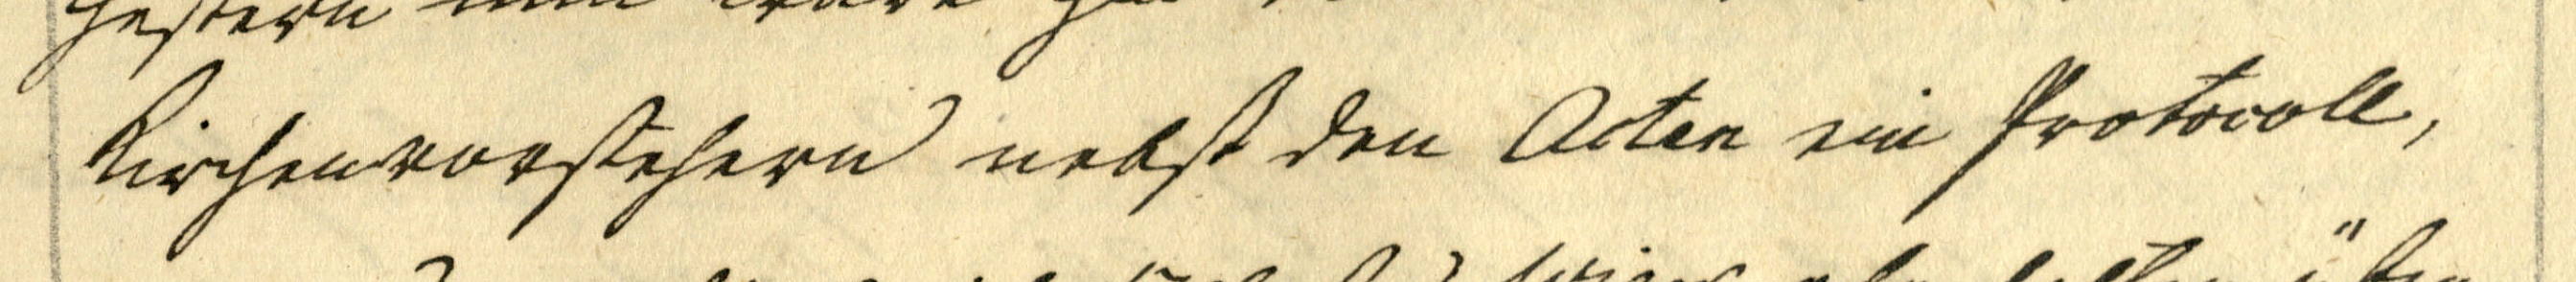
Kirchenvorstehern nebst den Acten ein Protocoll,
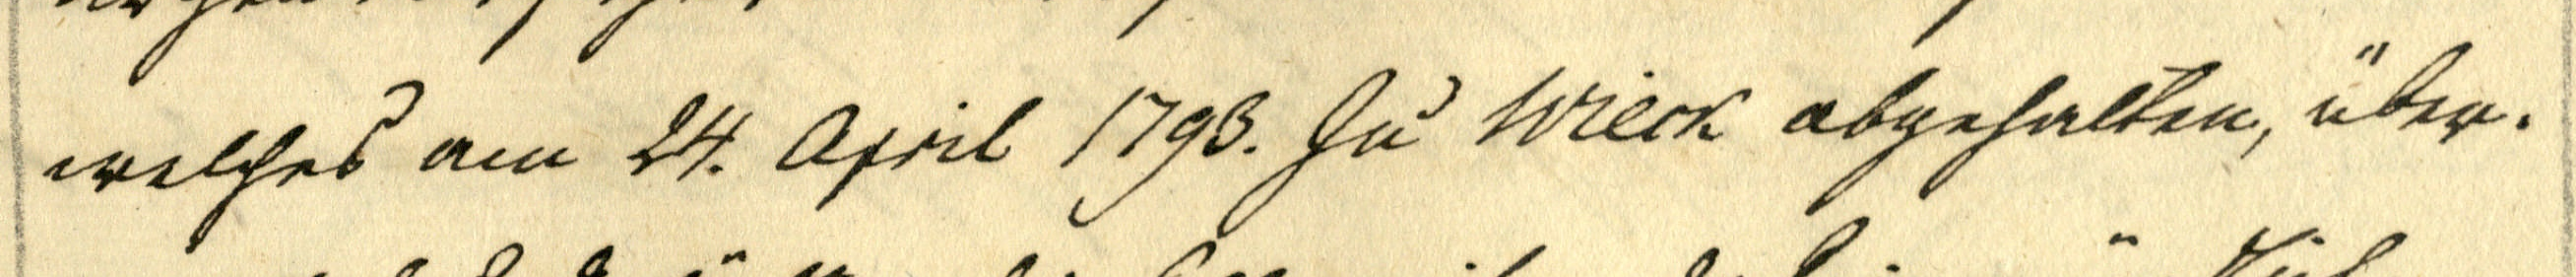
welches am 24. April 1793. zu Wieck abgehalten, über¬
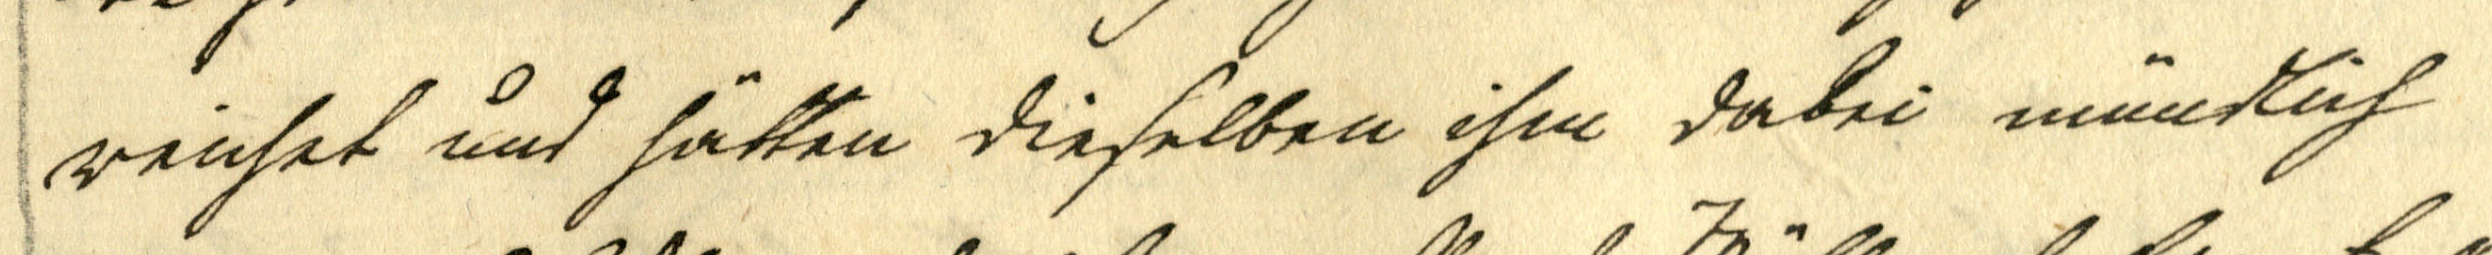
reichet und hätten dieselben ihm dabei mündlich
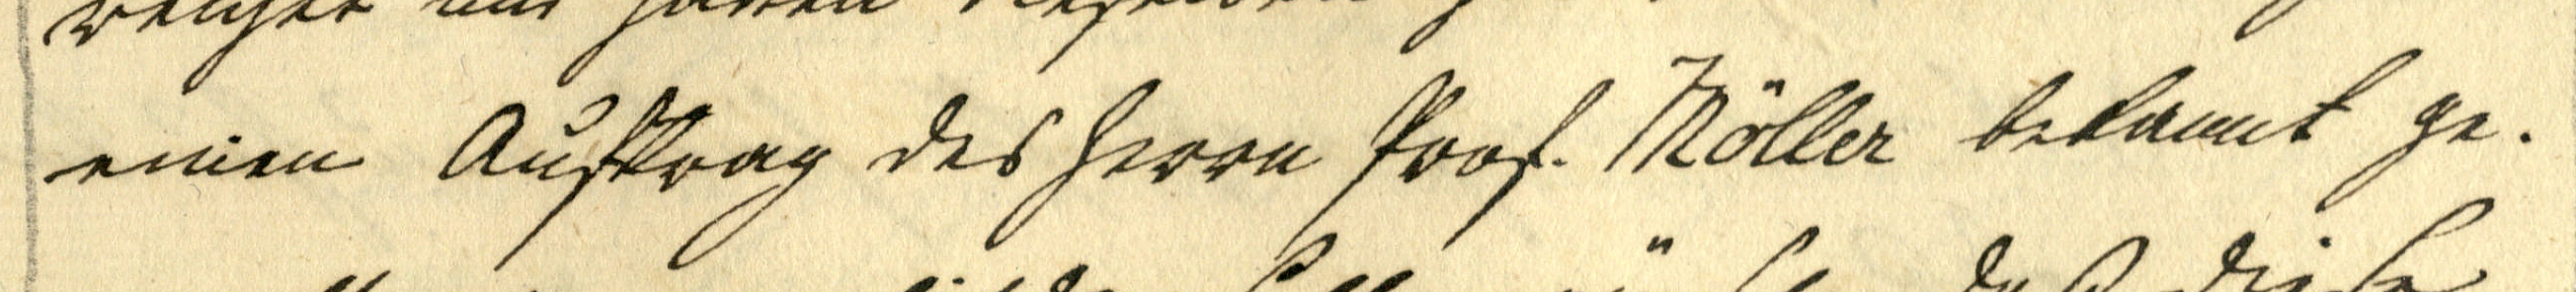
einen Auftrag des Herrn Prof. Möller bekannt ge¬
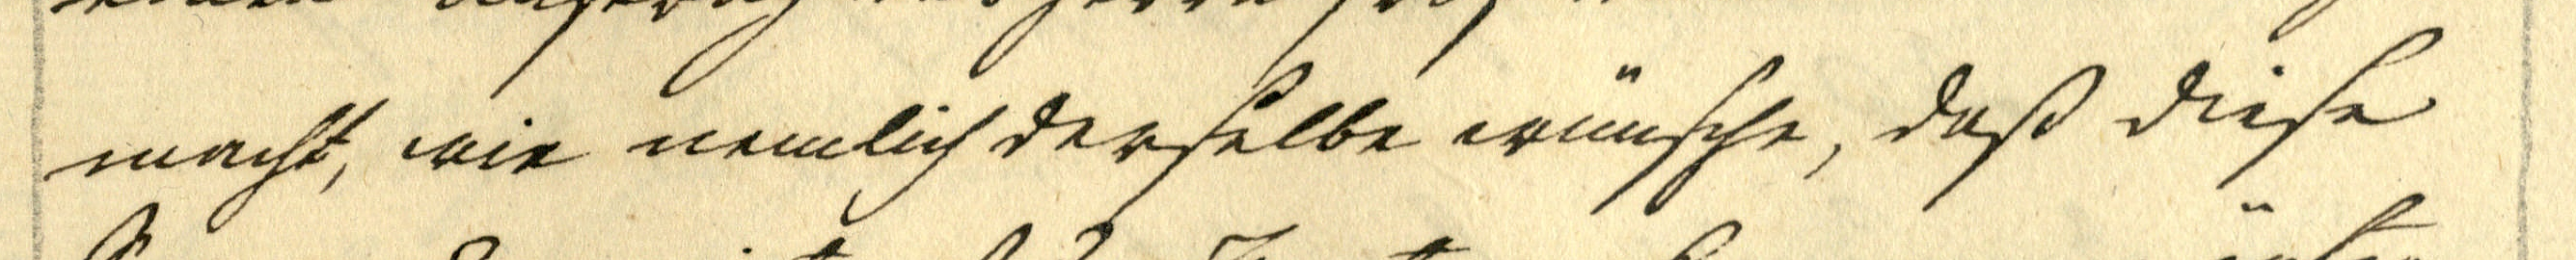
macht, wie nemlich derselbe wünsche, daß diese
